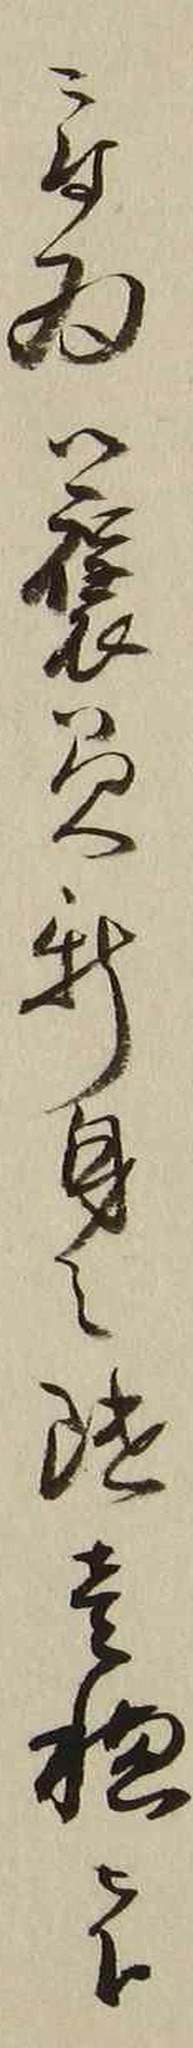ニ付為御褒美新身之鑓壱穂被下
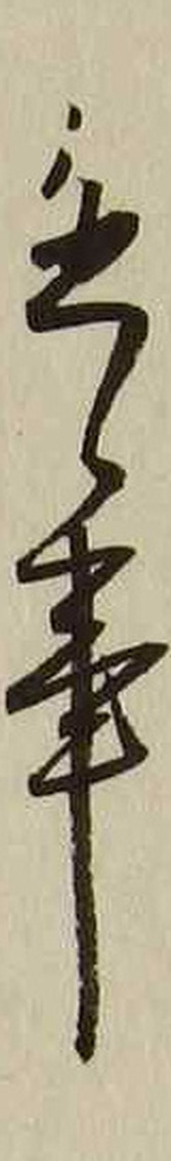置候事
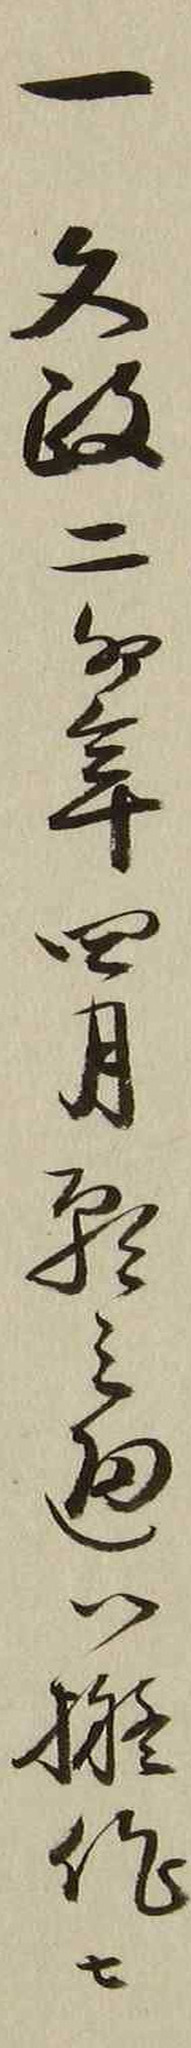一文政二卯年四月願之通御擬作被
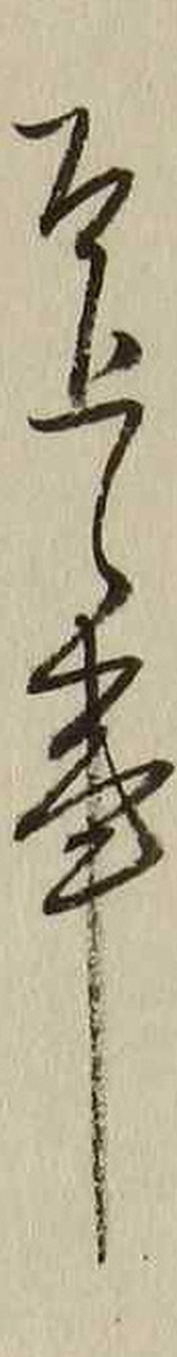召上候事
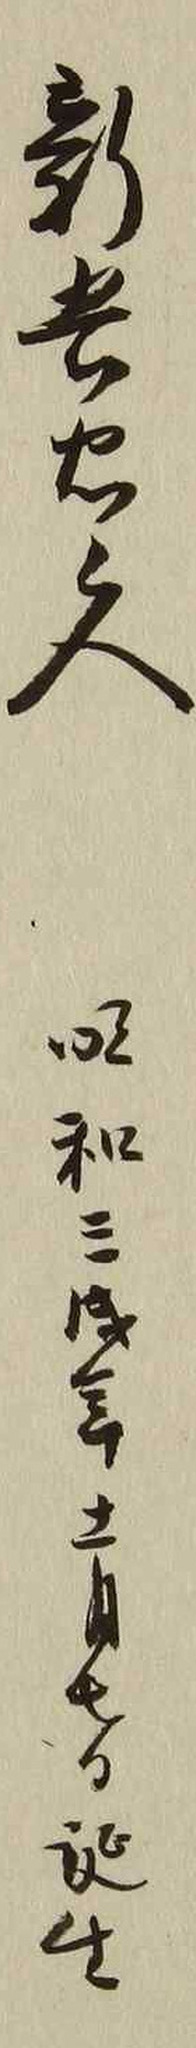新吾忠久明和三戌年十一月七日誕生
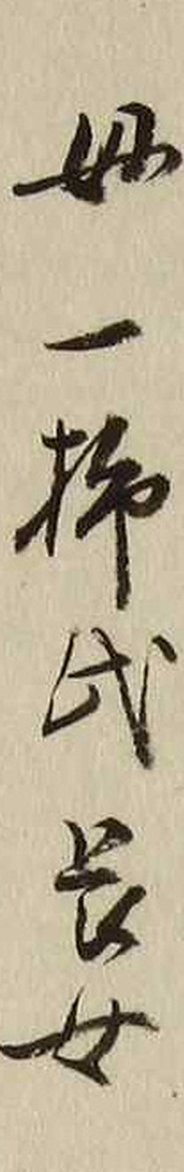母一柳氏長女
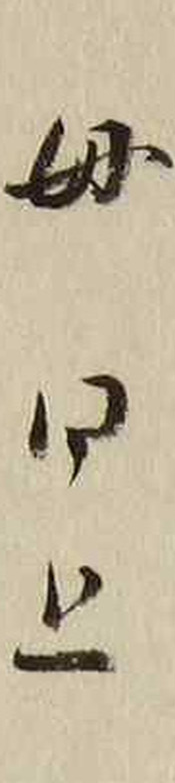母同上
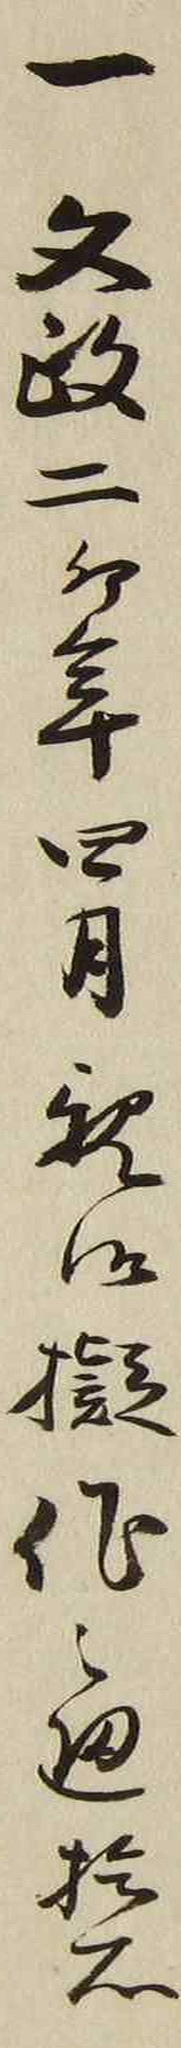一文政二卯年四月親御擬作之通拾石
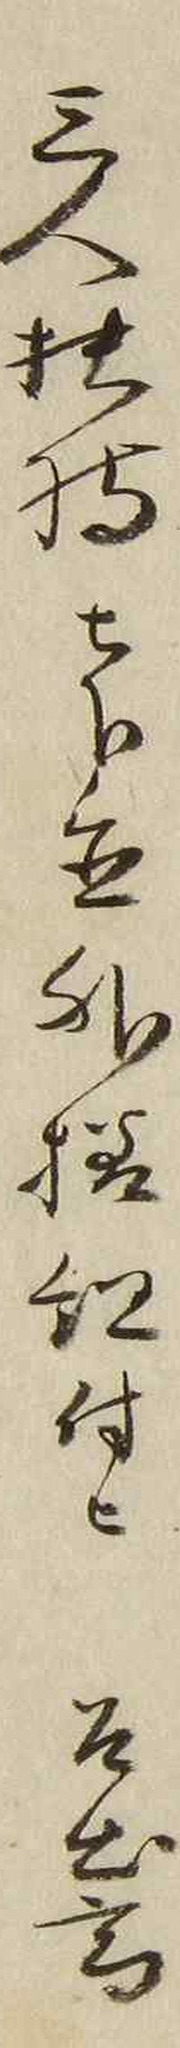三人扶持被下置外様組付被召出高
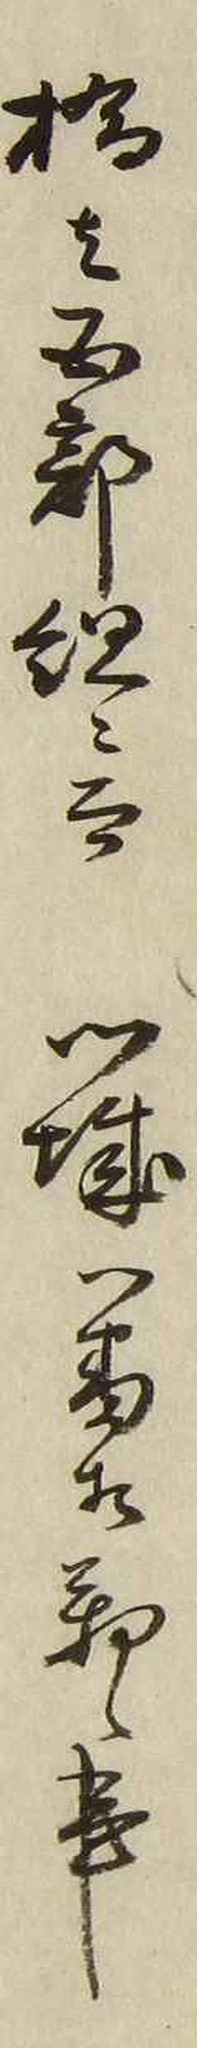橋与五郎組ニ而御城御番相勤候事

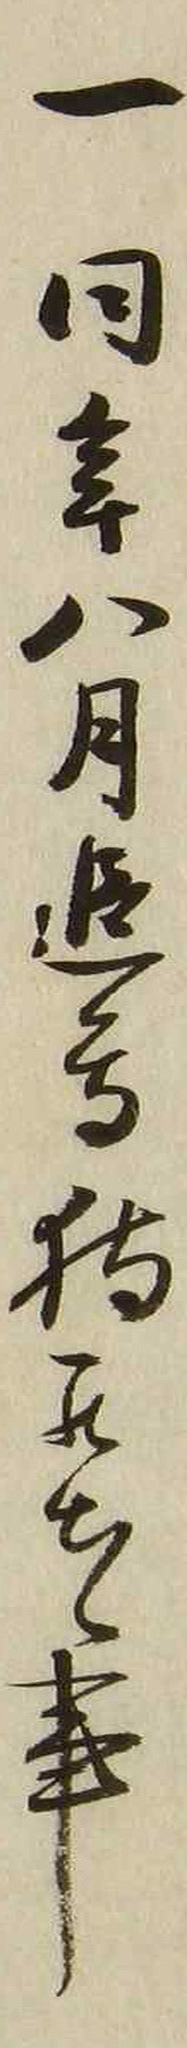一同年八月追鳥狩罷出候事
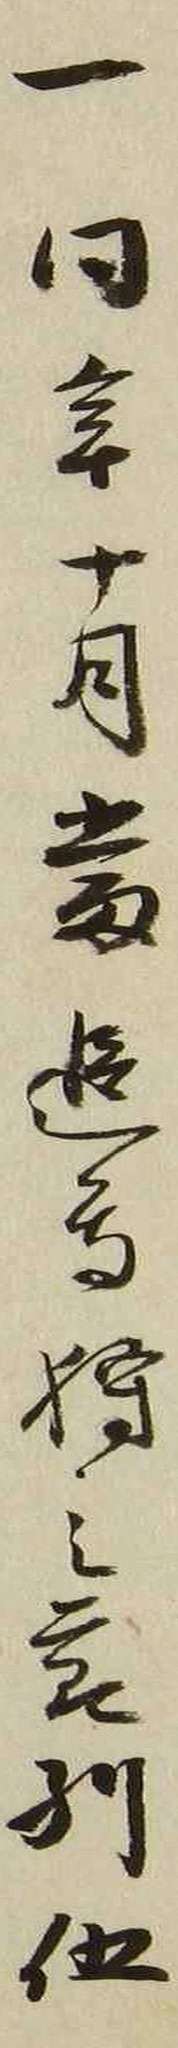一同年十月当追鳥狩之節列伍
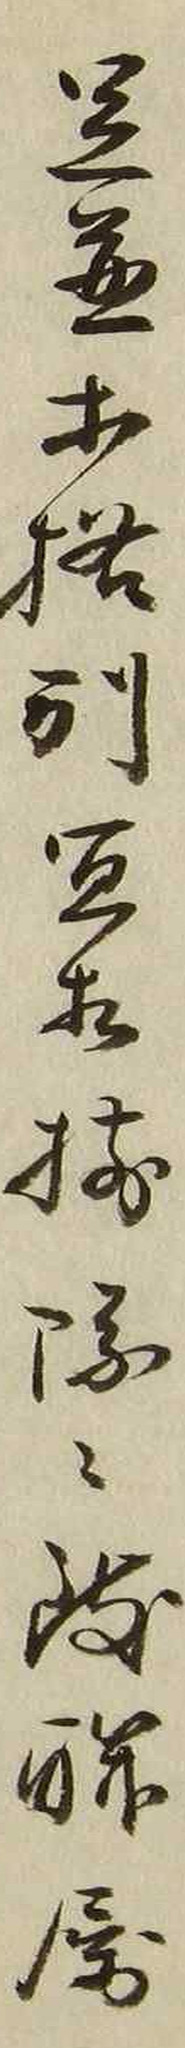足並等格別宜相揃隊々致聯属
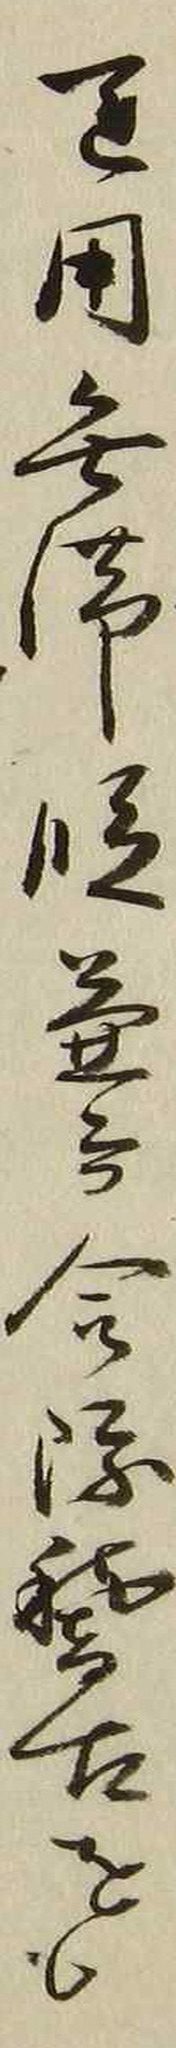運用無滞段兼而合隊稽古をも
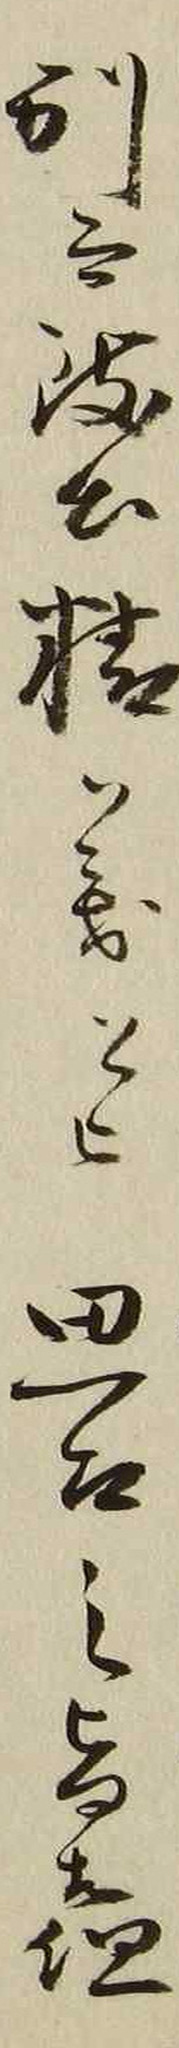別而致出精候義と被思召之旨相組
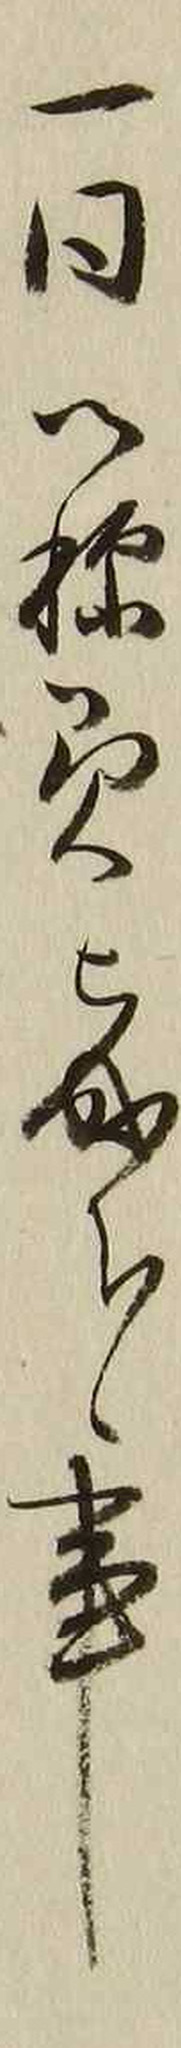一同御称美被成下候事
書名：諸士系譜　巻之288　さ之部20
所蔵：会津若松市立会津図書館
